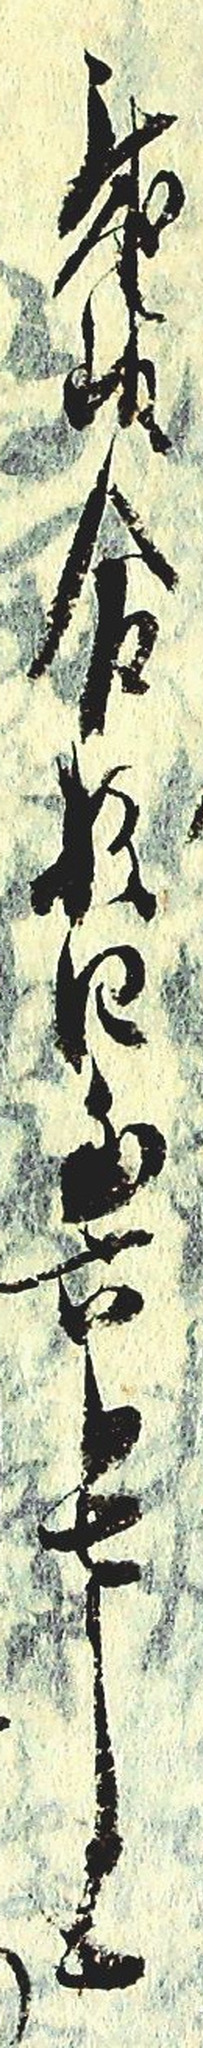床銀合拾四匁六分七厘
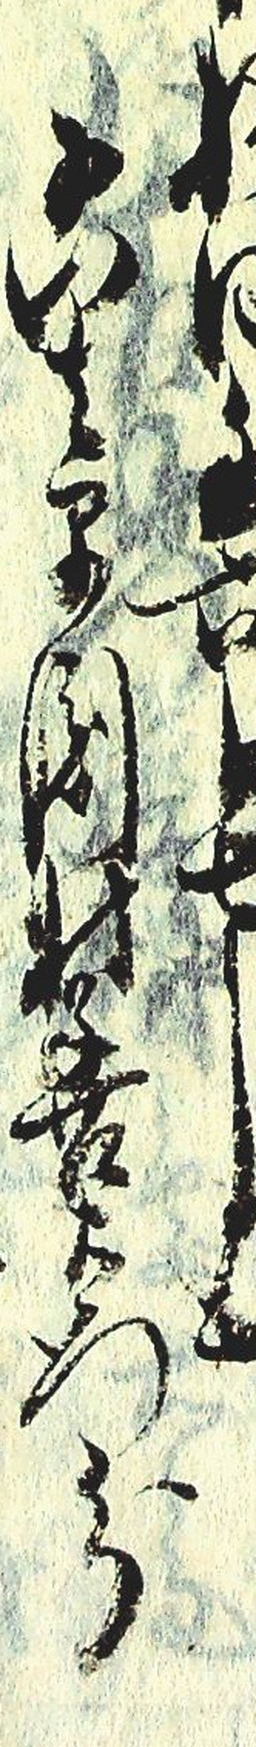右は早淵村善右衛門分
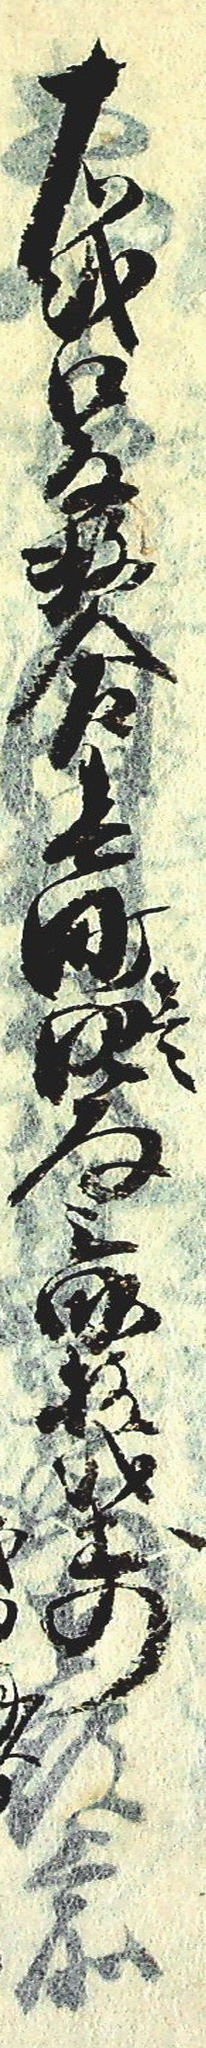右弐口反数合壱町壱反三畝拾弍歩
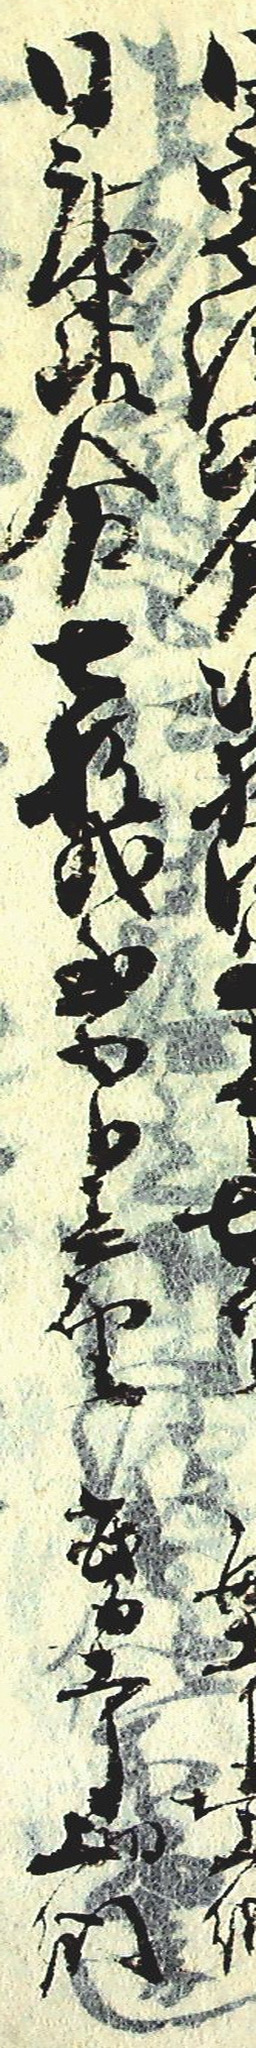同床銀合七拾弐匁五分壱厘当酉十一月切上納
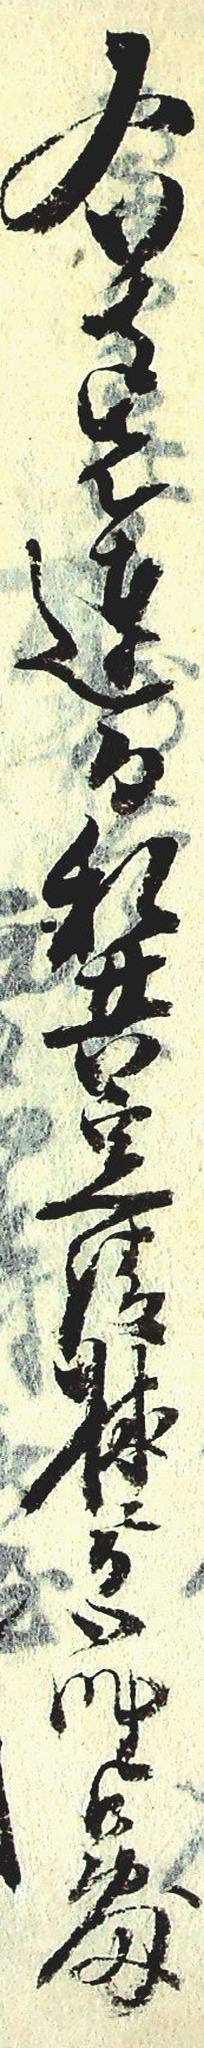右は先達て私共定請林にて御座候処
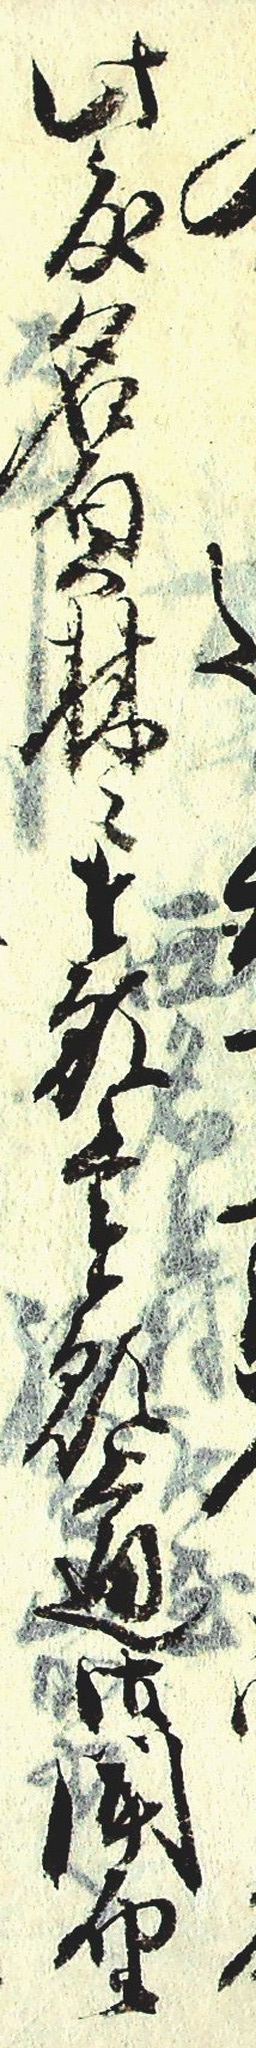此度名負林に奉願上奉願上通御聞届
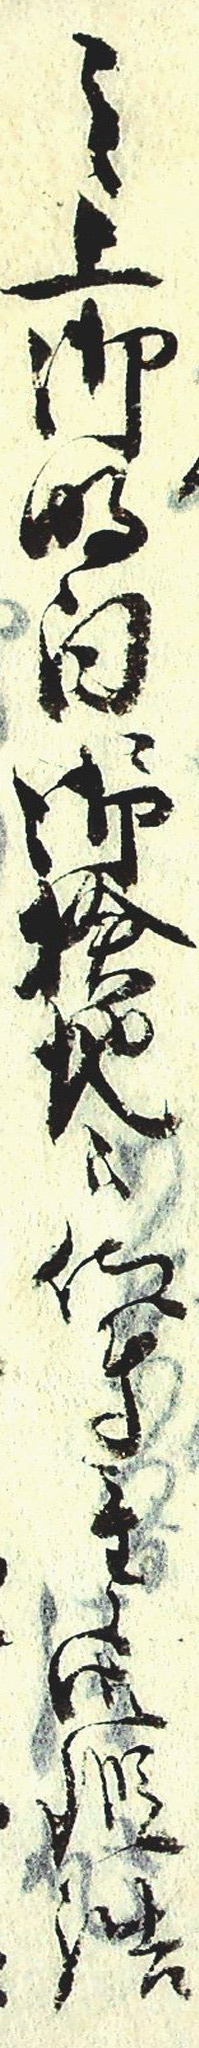之上御明白に御検地被仰付重々御鍛詰
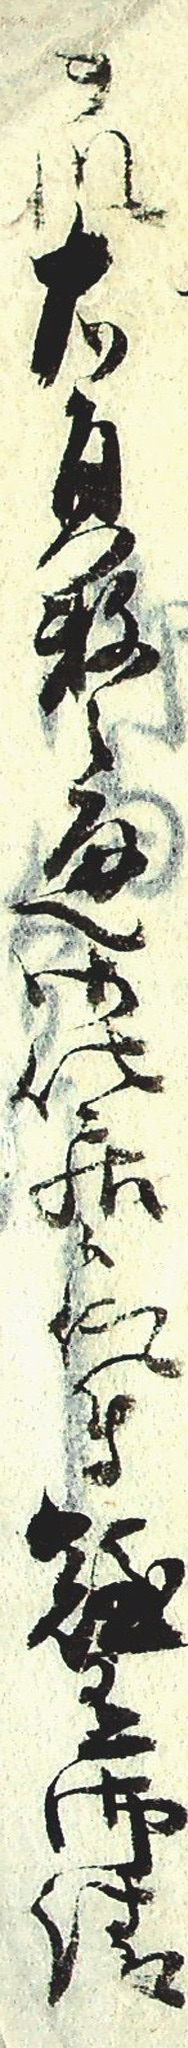を以右員数之通御仕居被仰付難有御請

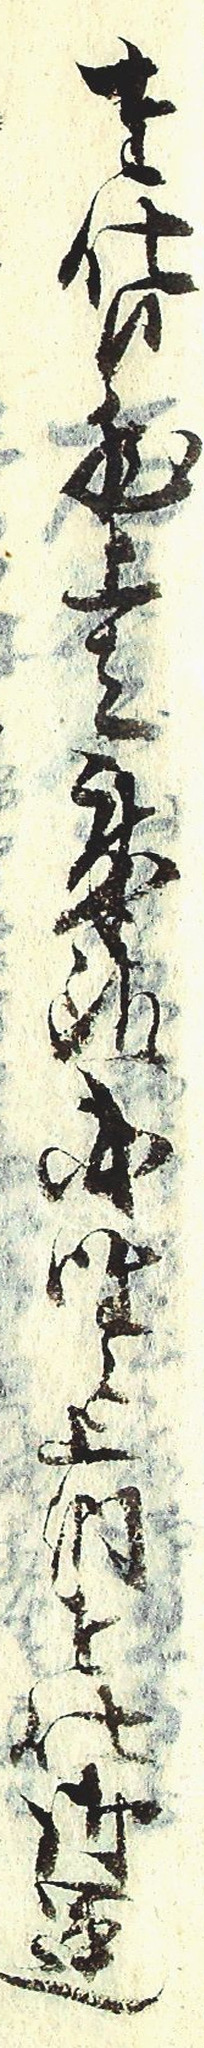書仕候然上は床銀当坐に上納奉仕御運
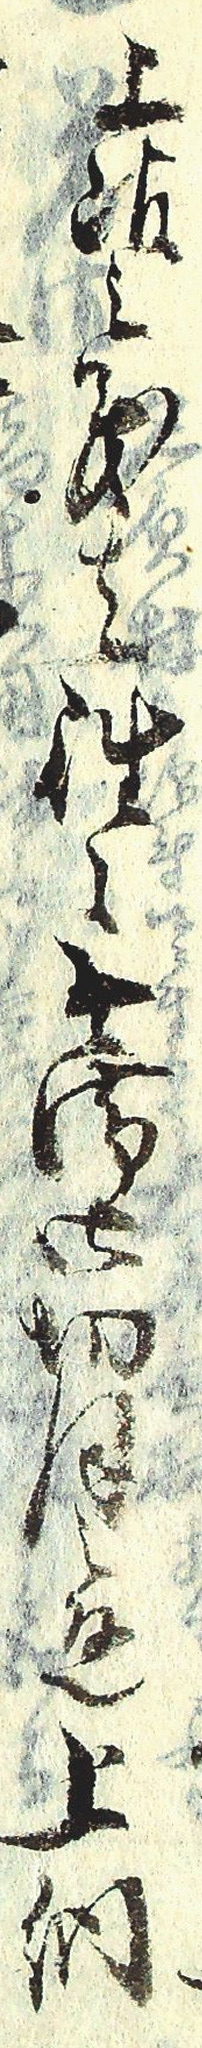上銀之義は往々無滞御切月之通上納
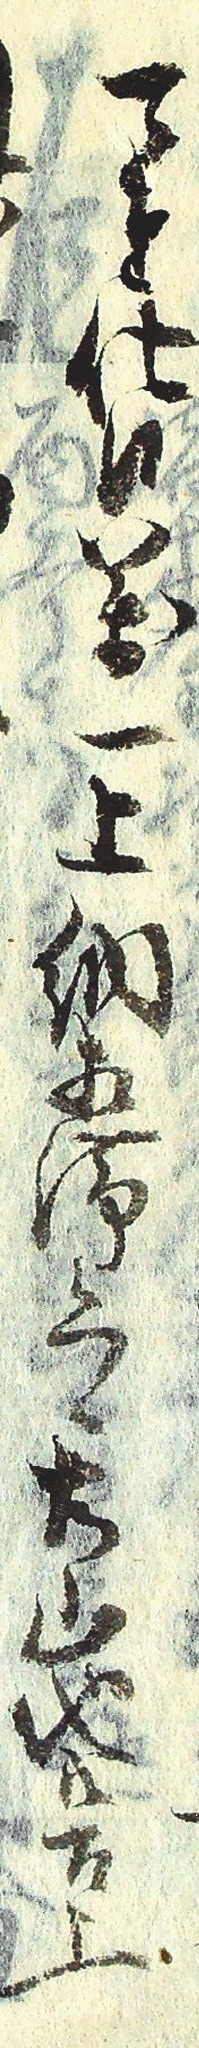可奉仕候万一上納相滞候はゝ右山地被召上
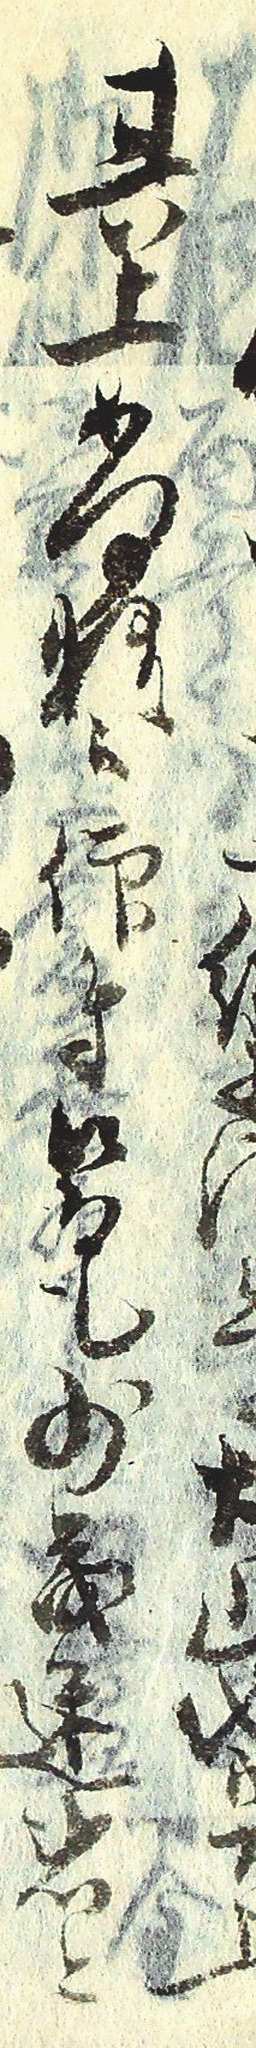其上如何様被仰付候ても少も迷惑と
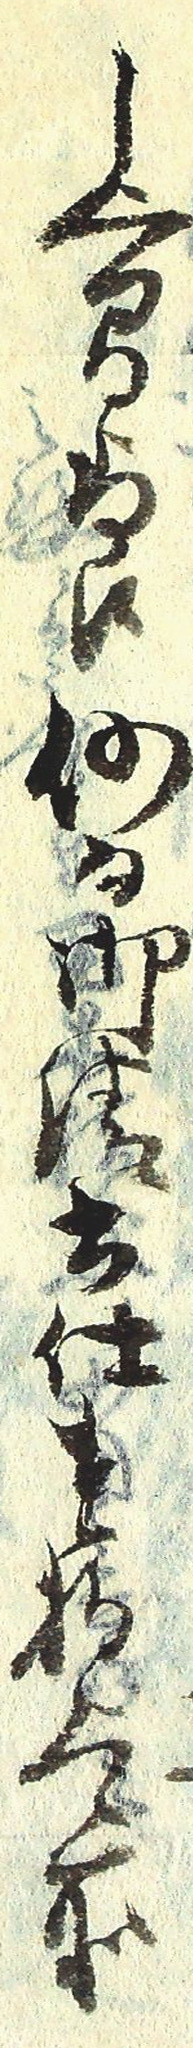申上間布候仍て御請書仕奉指上候所
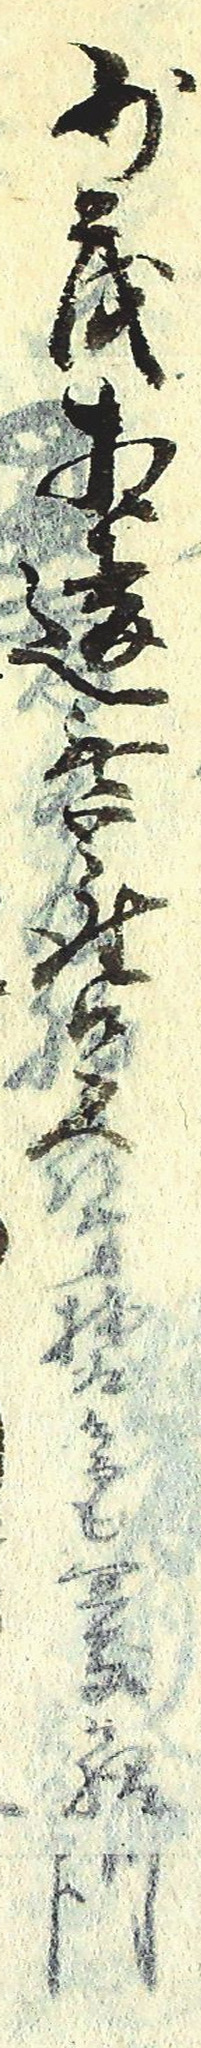少も相違無御座候以上
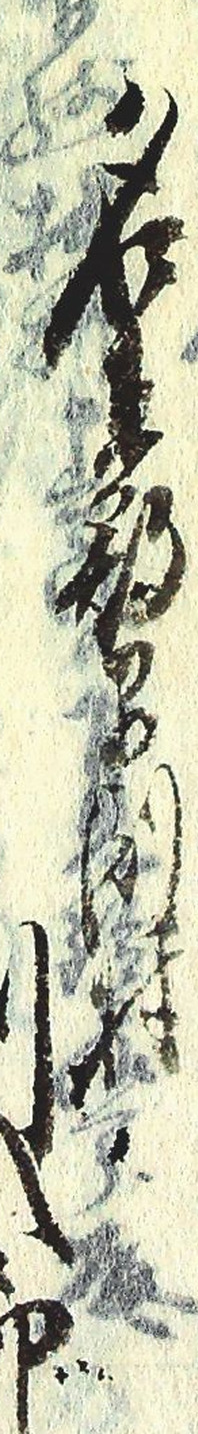名東郡早淵村
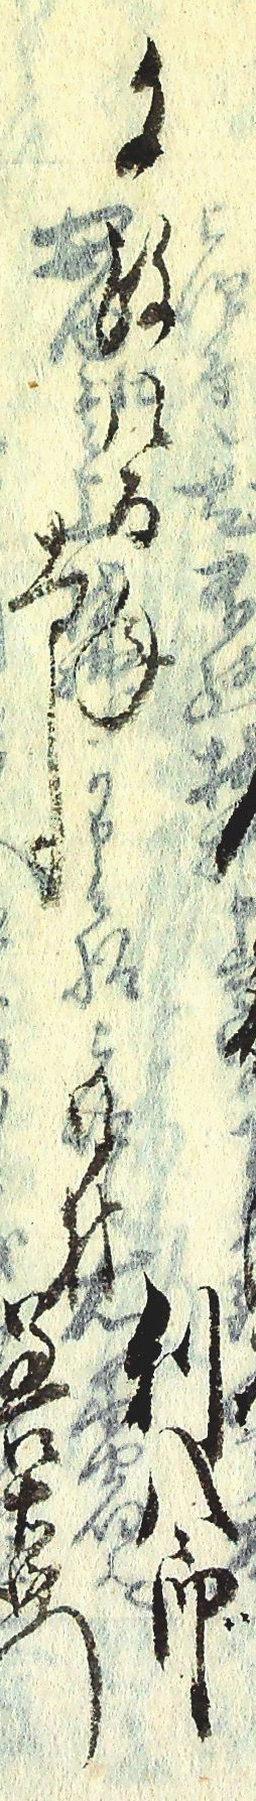文政八酉年利八郎
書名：諸御願書控(弐番）
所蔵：鳴門教育大学 Naruto University of Education
